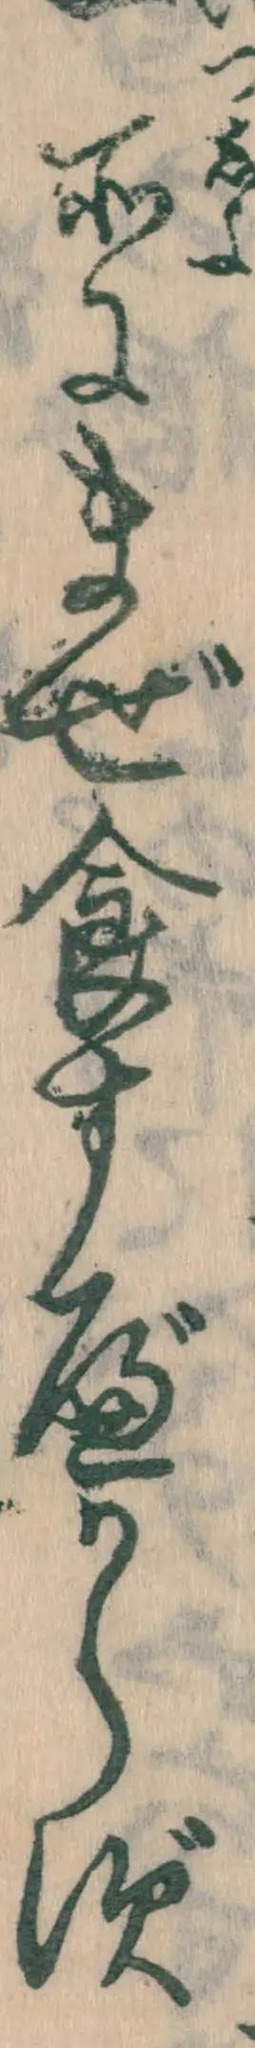一所にまぜ食すべからず
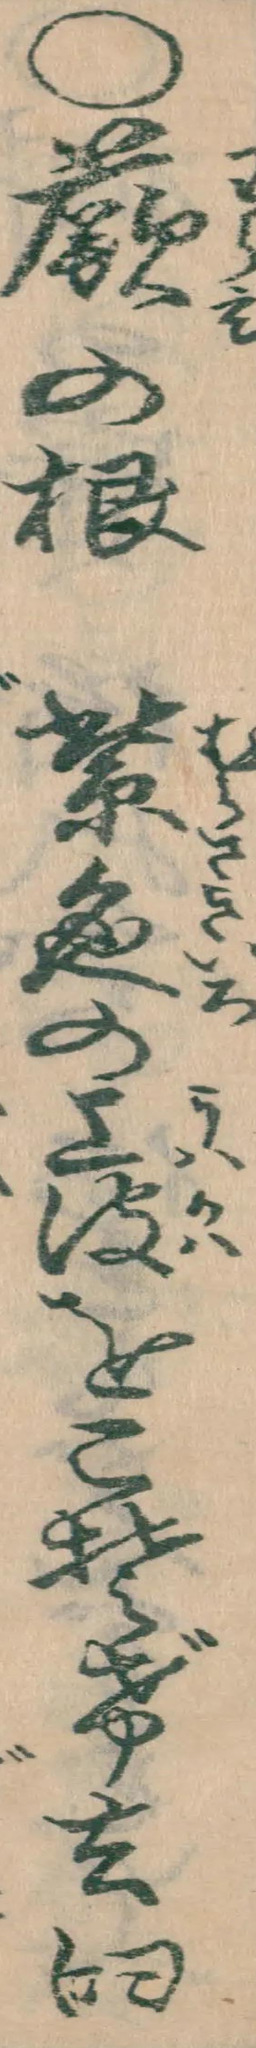〇蕨の根紫色の上皮をこそげ去臼
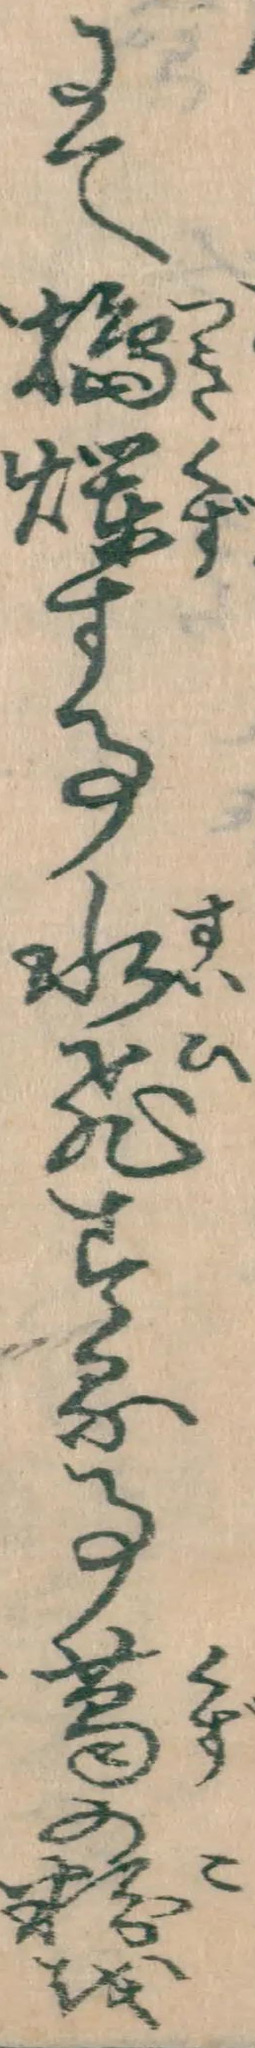にて搗爛す事水飛する事葛の粉を
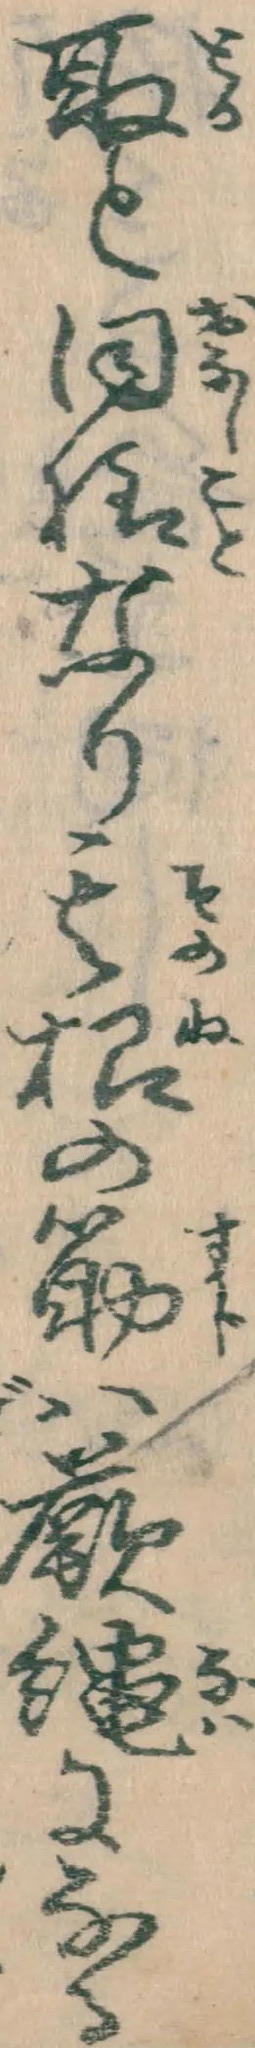取と同様なりその根の筋は蕨縄になる
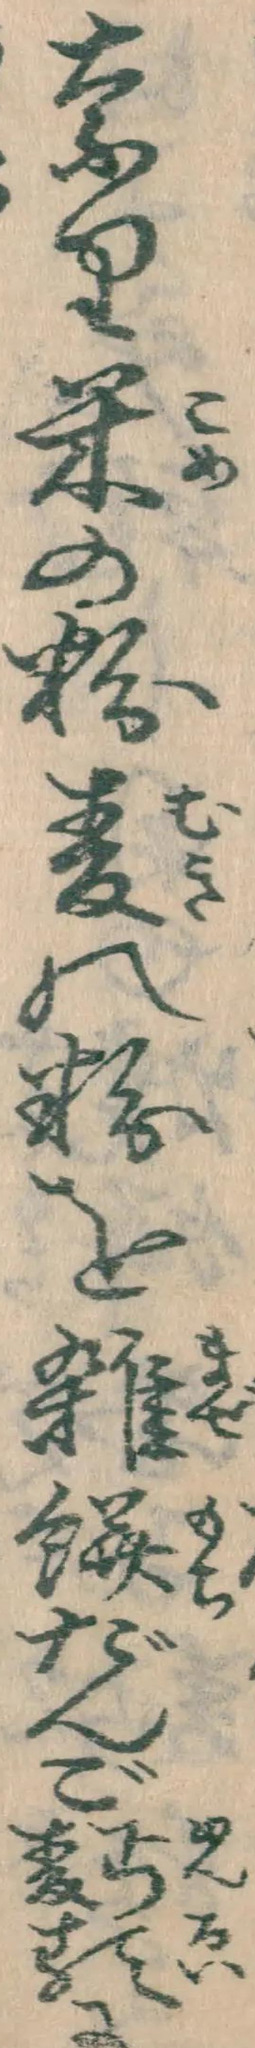なり米の粉麦の粉を雑餅だんご麺類に
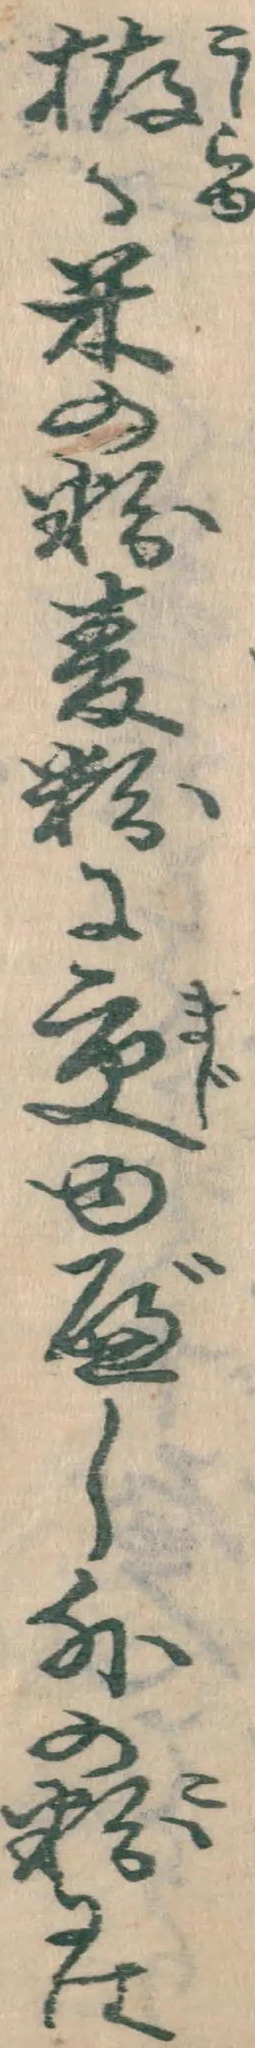拵る米の粉麦粉に交ゆべし外の粉には
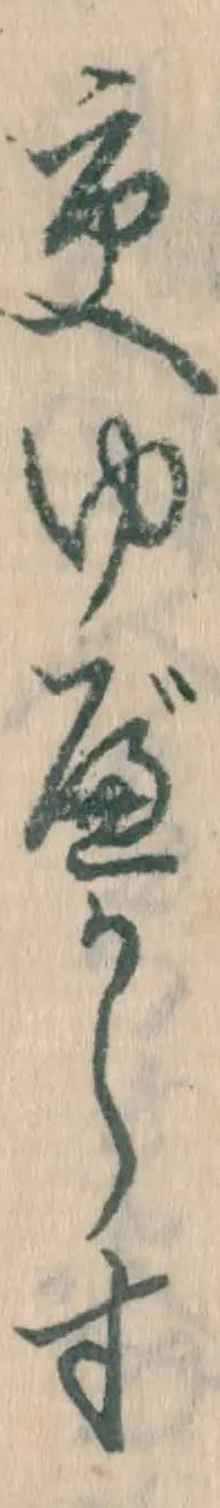交ゆべからす
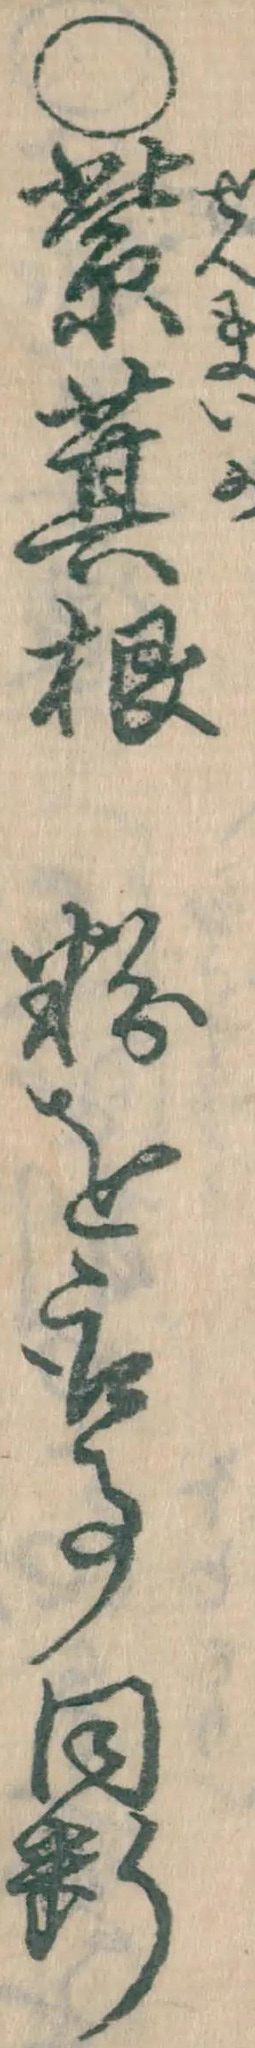〇紫茸根粉を取事同断

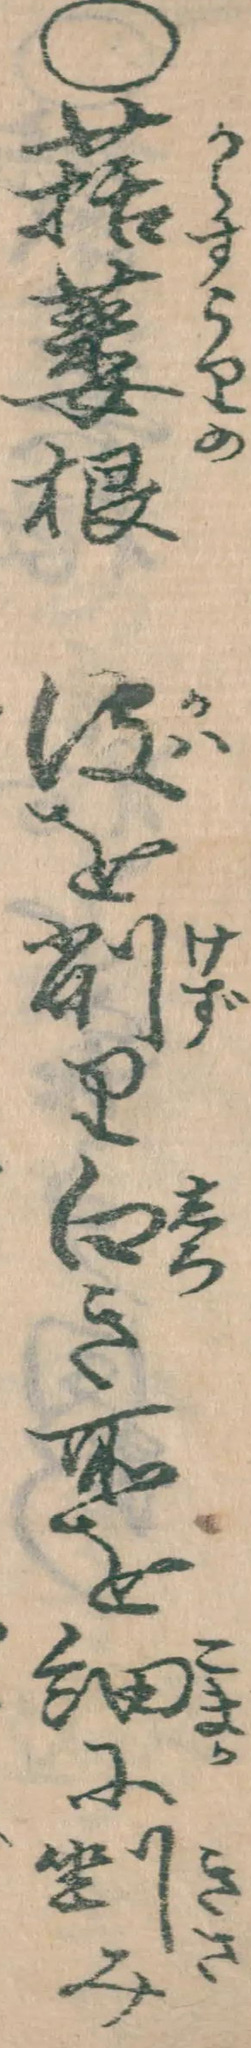〇根皮を削り白き所を細に刻み
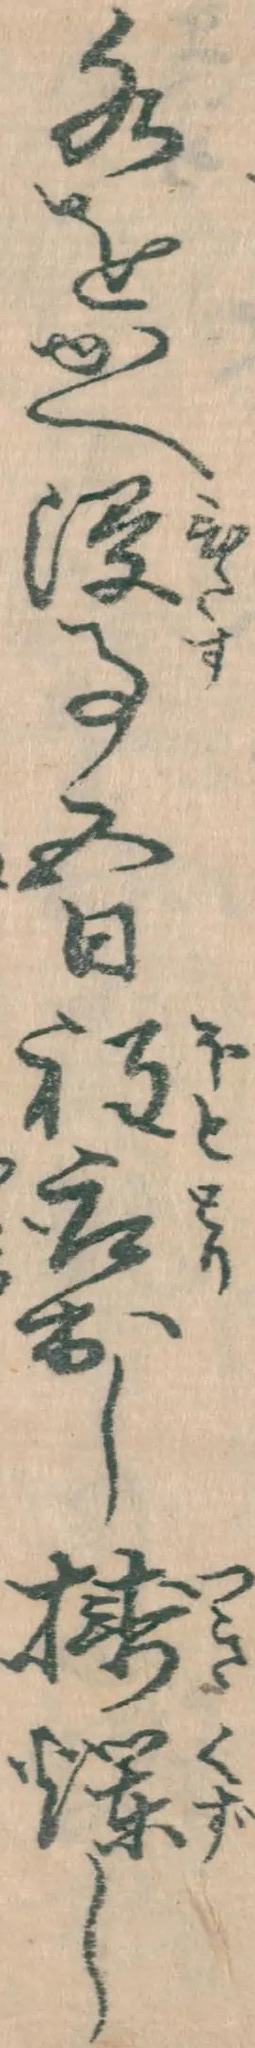水をかへ浸事五日程取出し搗煠し
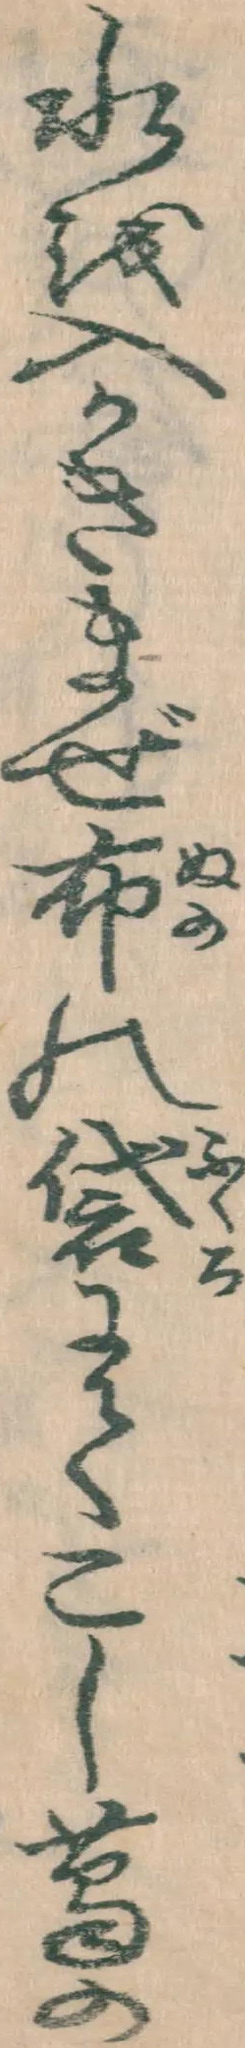水を入かきまぜ布の袋にてこし葛の
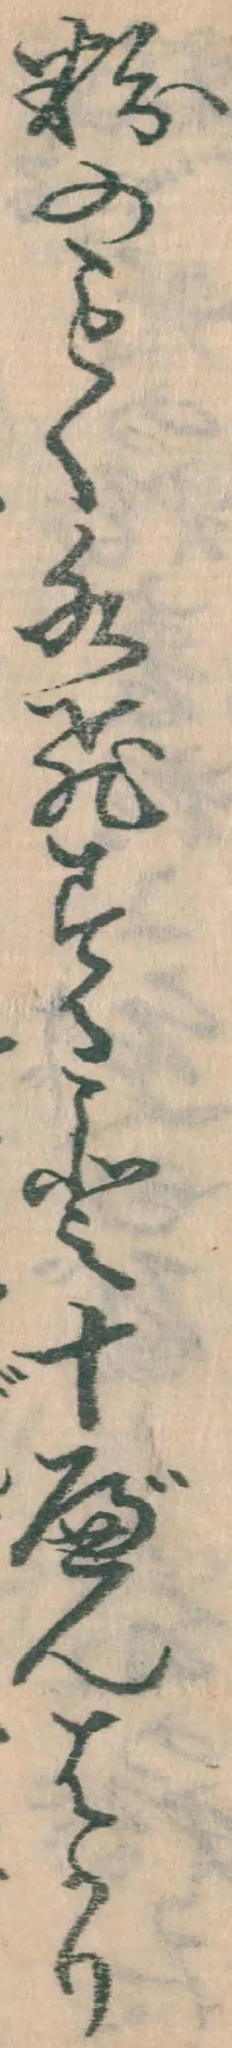粉のことく水飛すること十べんはかり
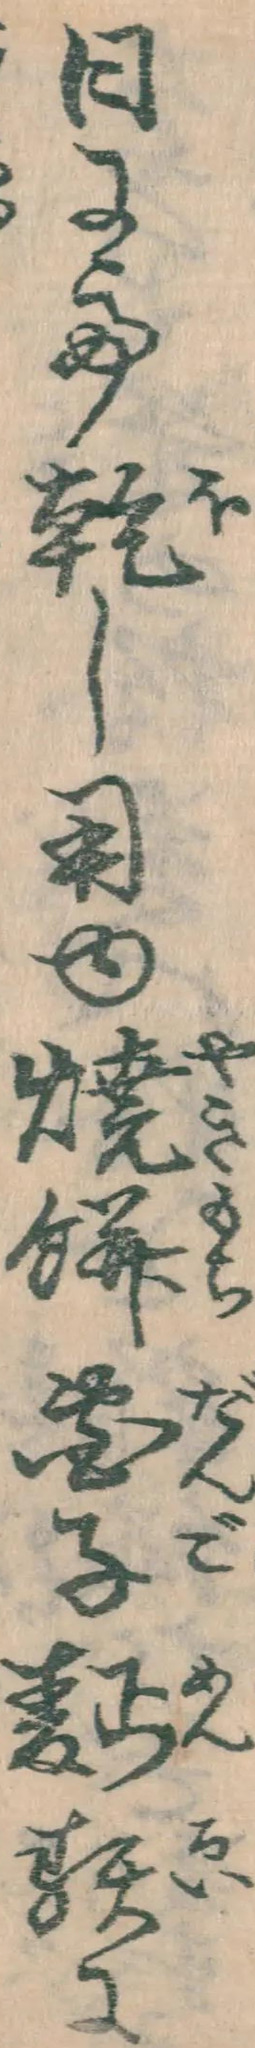日にて乾し用ゆ焼餅団子麺類に
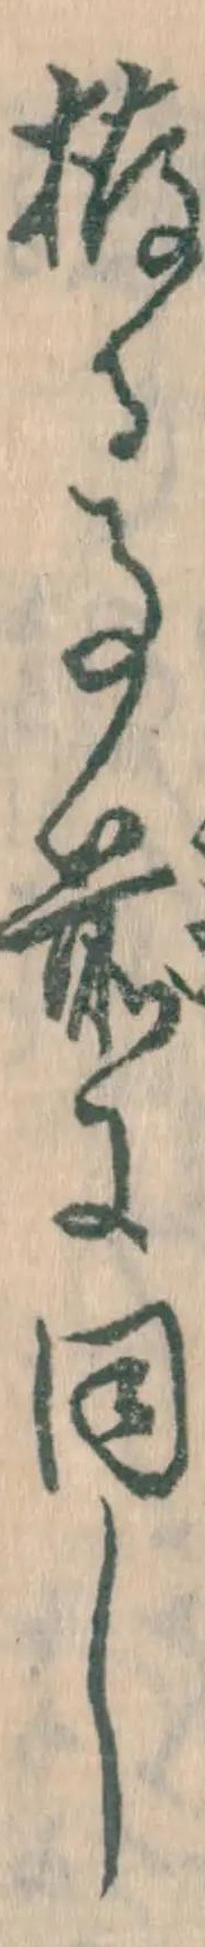拵る事前に同じ
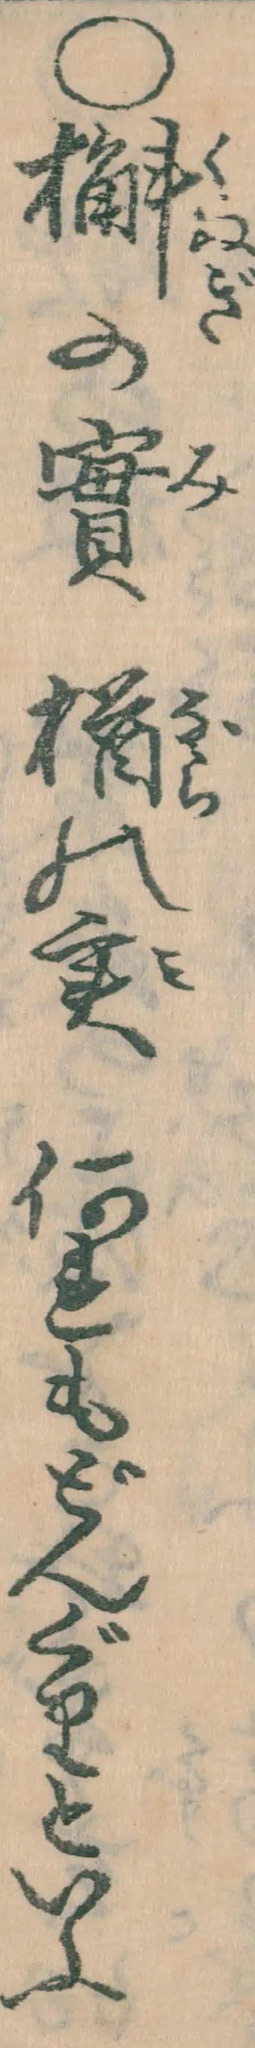〇檞の実楢の実何れもどんぐりといふ
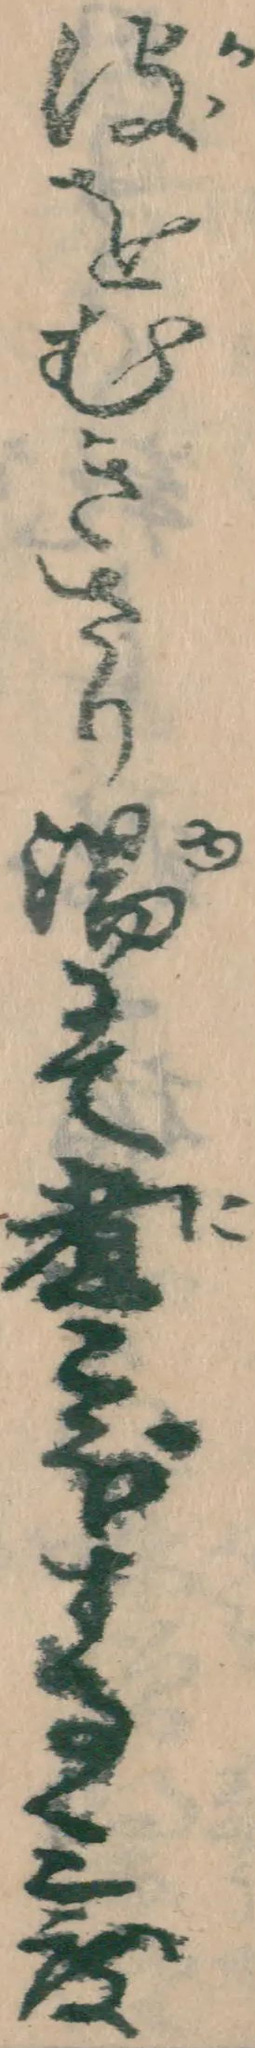皮をむきさり湯にて煮こぼす事三度
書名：救荒鄙諭
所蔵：国立国会図書館 National Diet Library, JAPAN
